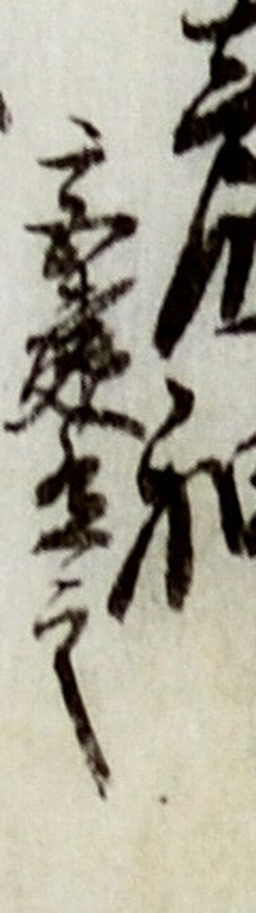宮建有之
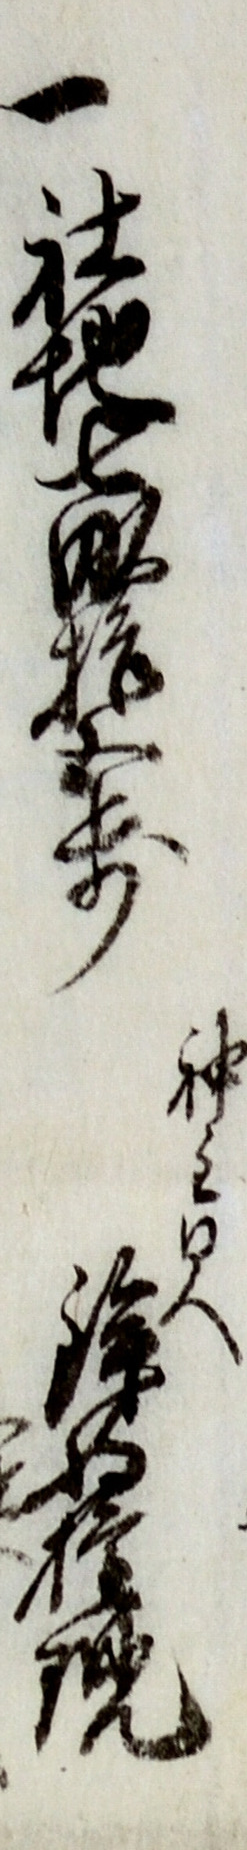一社地七畝拾五歩鉾持権現
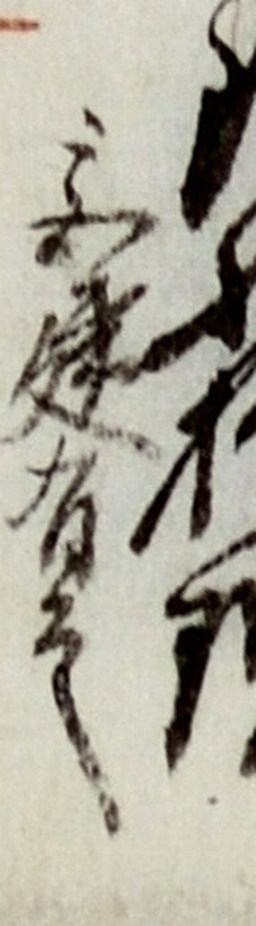宮建有之

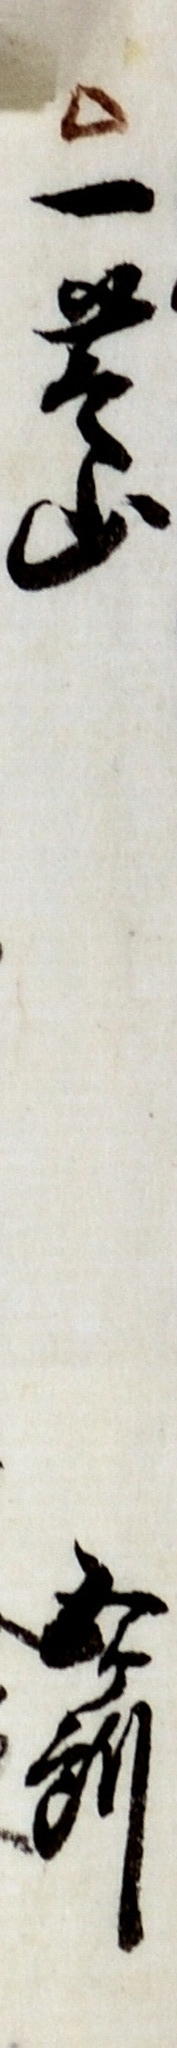△一芝山五ヶ所
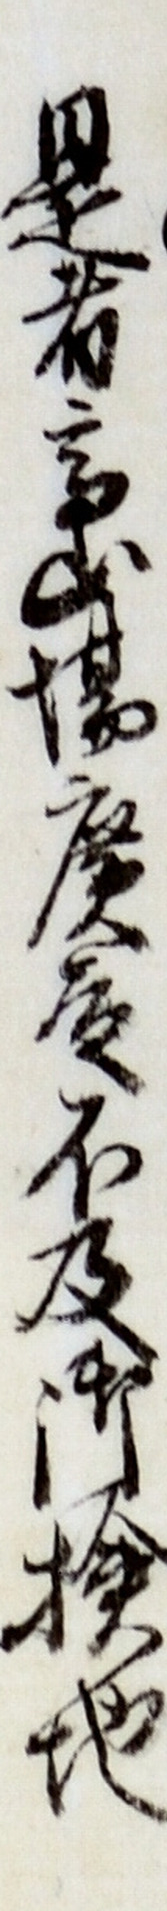是は高山場広故不及御検地

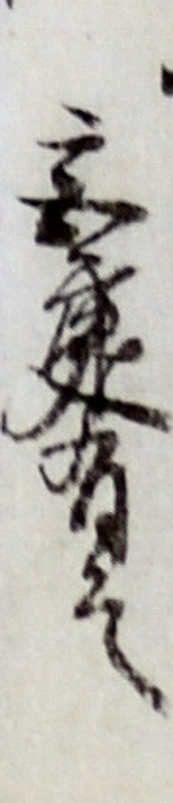宮建有之
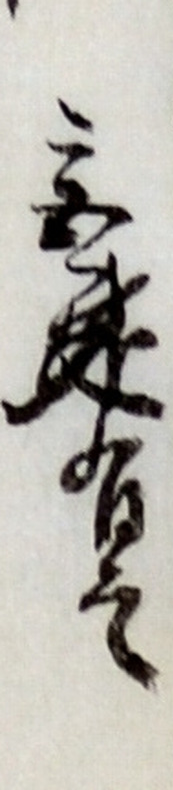宮建有之
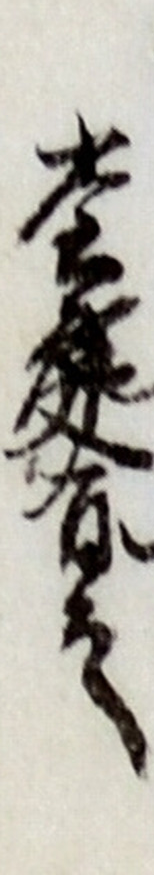宮建有之
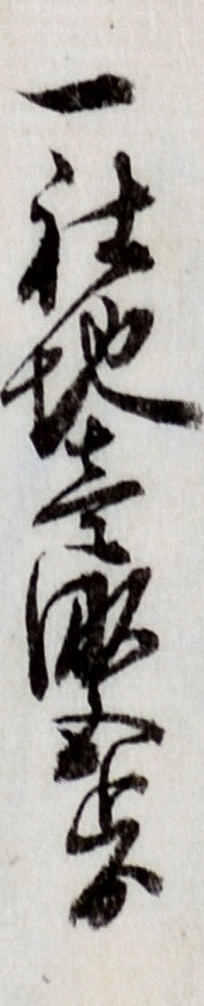一社地壱畝五歩山神
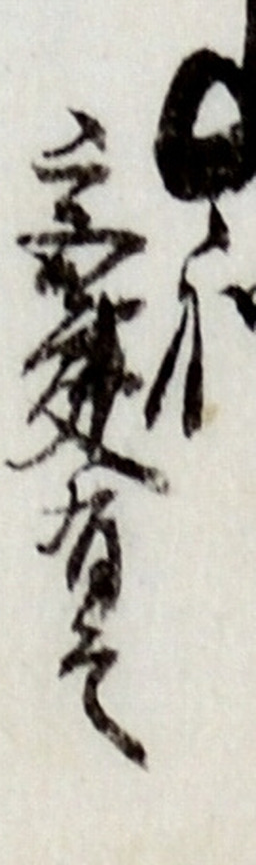宮建有之
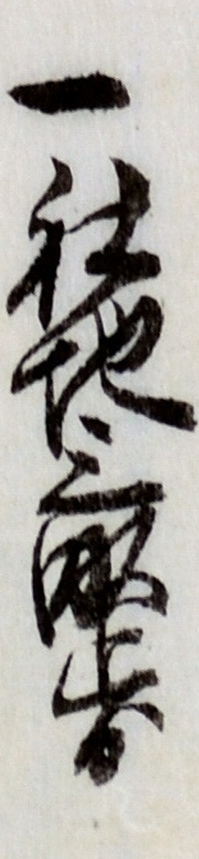一社地三畝歩山神
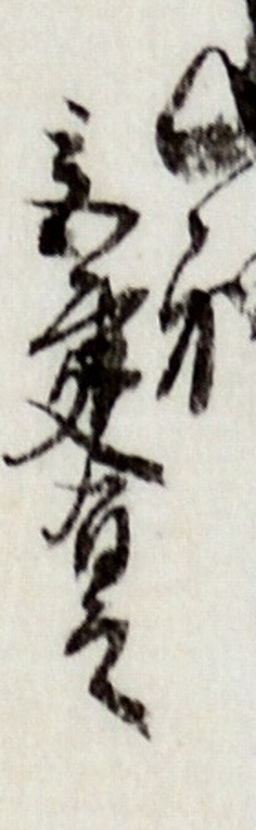宮建有之
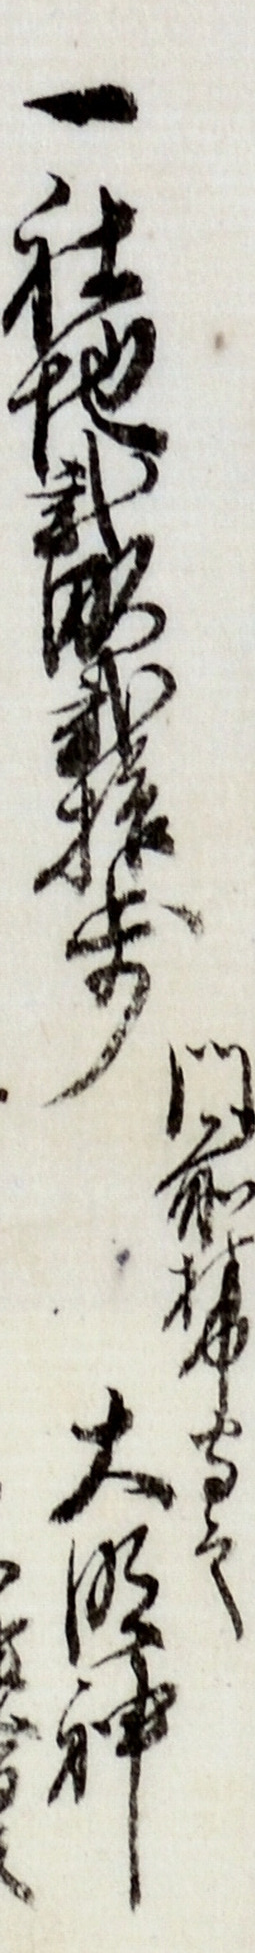一社地弐畝弐拾歩大明神
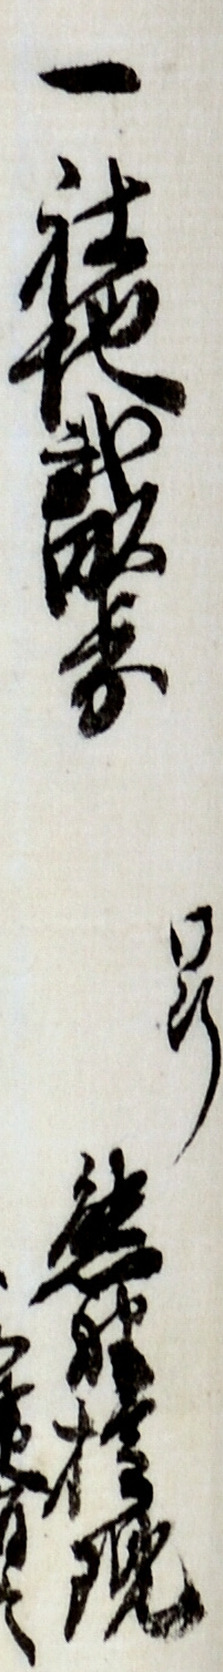一社地弐畝歩熊野権現
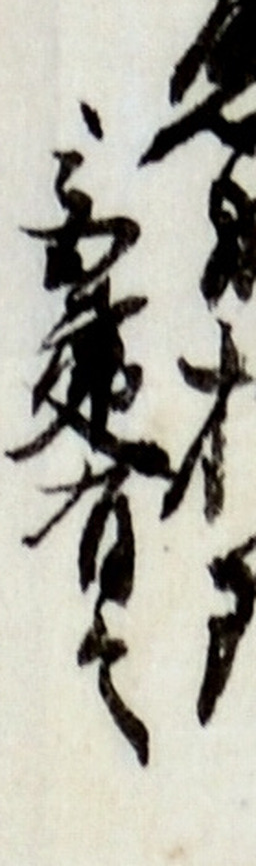宮建有之
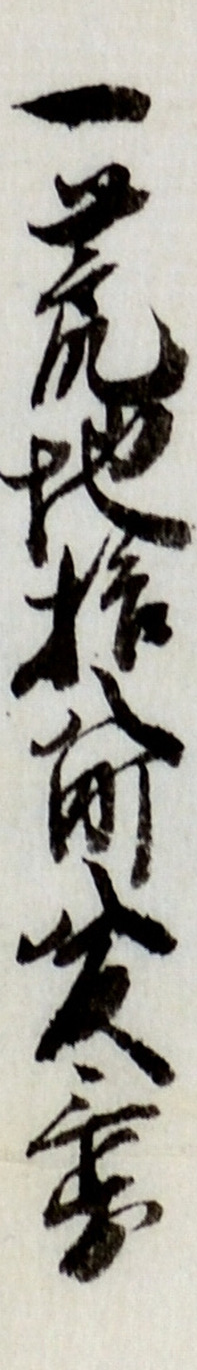一荒地拾八町八反歩村中
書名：御領分中山林社地手控
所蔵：伊那市立高遠町図書館・合同会社AMANE
